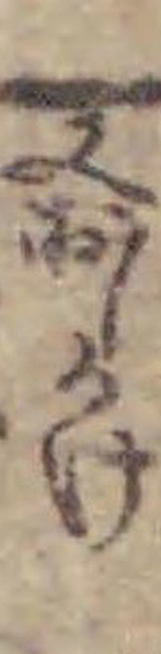又おしかけ
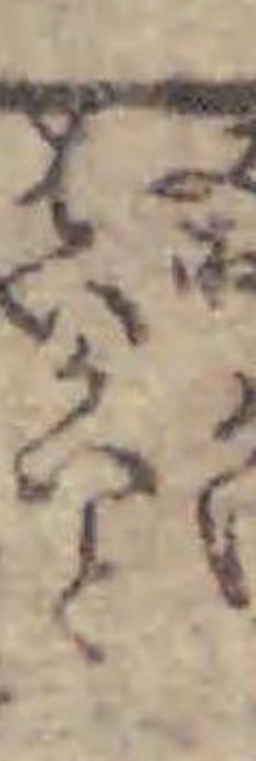はいかいと
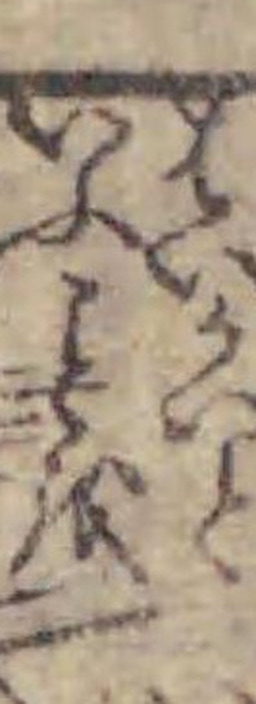いふことを
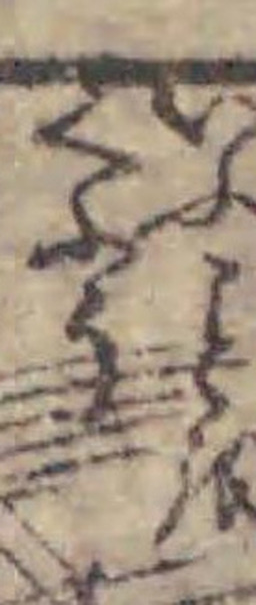くふう
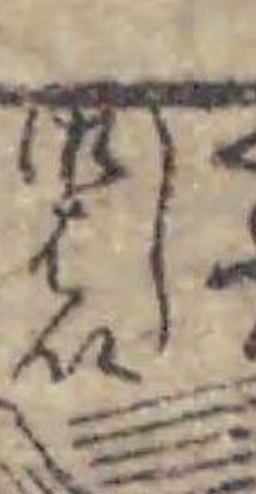御はい
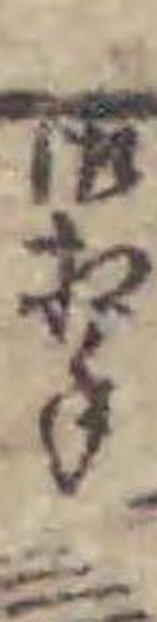御相手
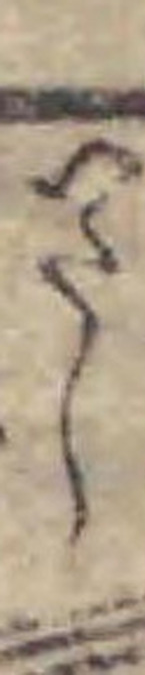いたし
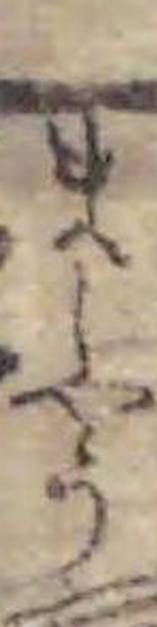ましやう
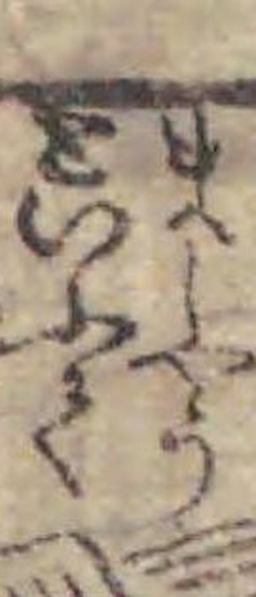といふて
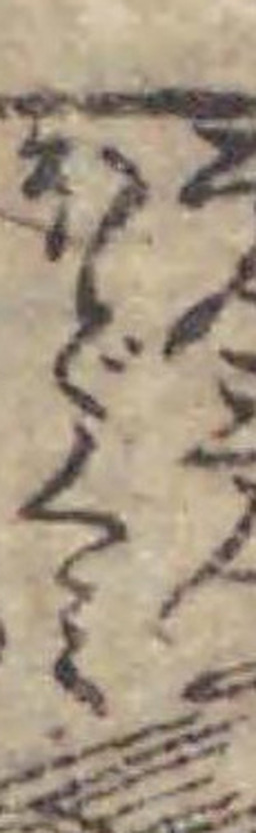ほどくみ
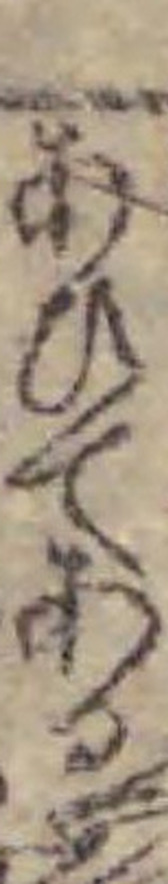あひてある
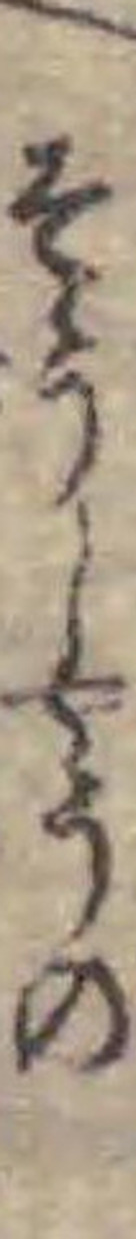そうしやうの
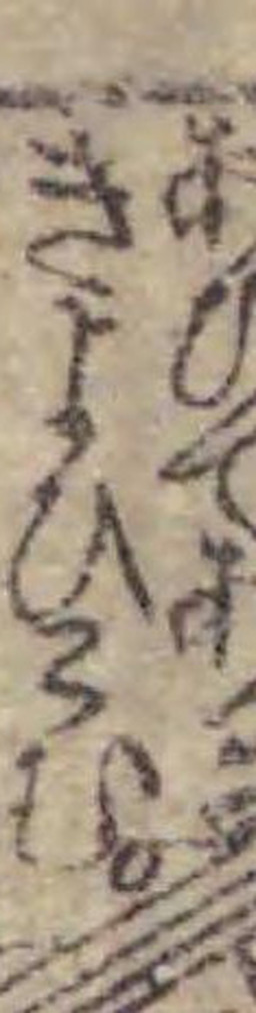きよひこむ
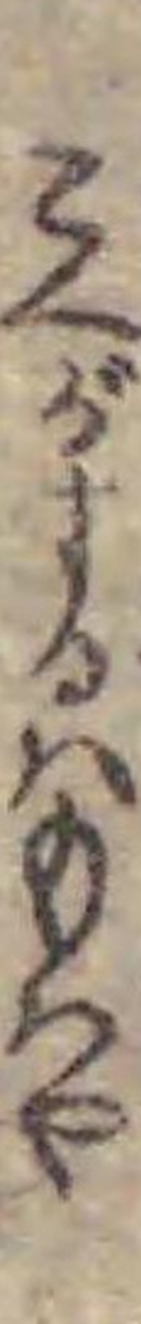こへがするはもはや
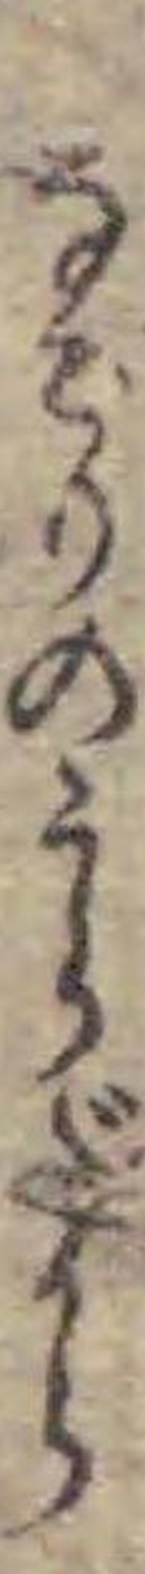なごりのうらだから
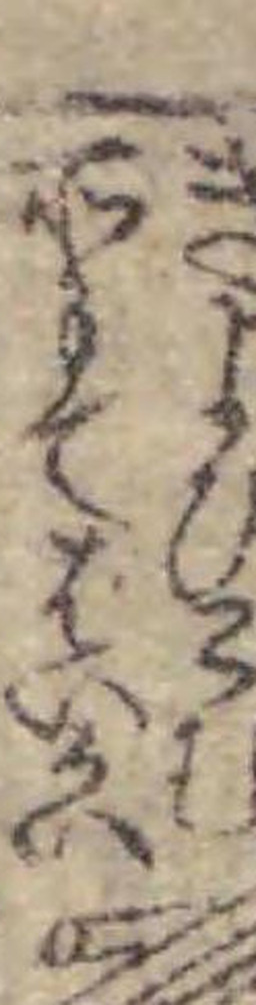所にてはいかい
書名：本樹真猿浮気噺 : 3巻
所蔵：国立国会図書館 National Diet Library, JAPAN
